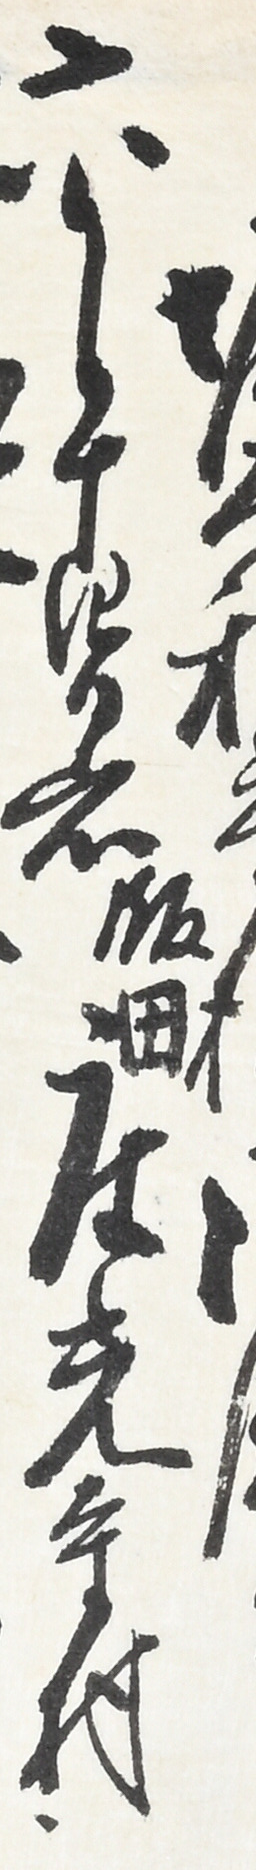六月十四日着飯田座光寺村
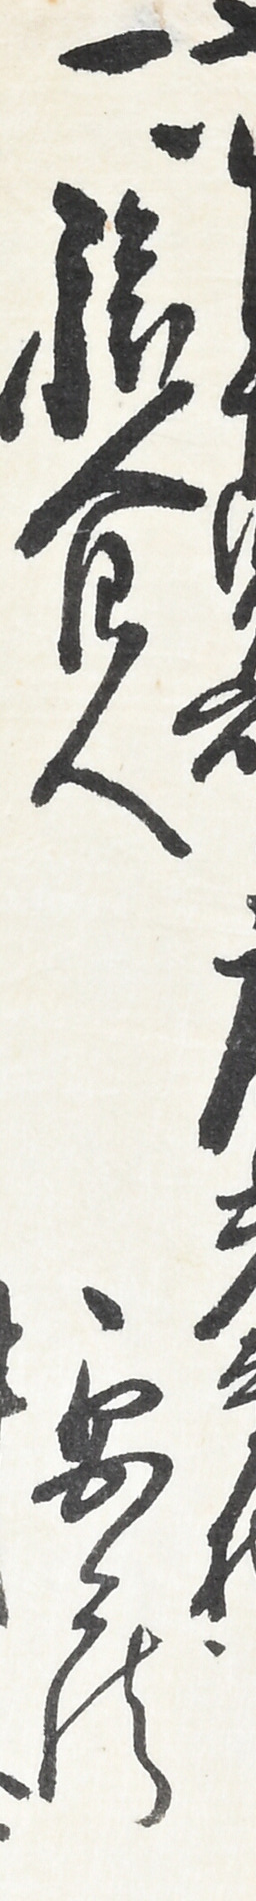一旅人四人安蔵・
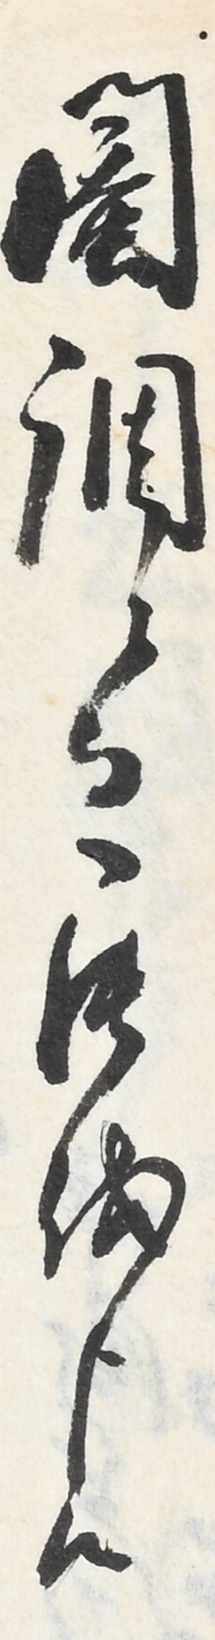関調ニ而罷越申候
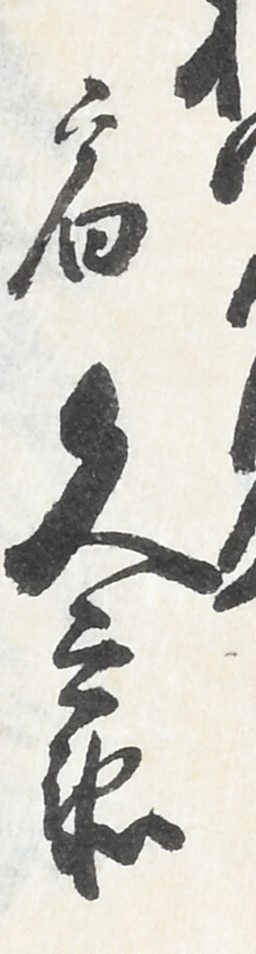宿宇兵衛
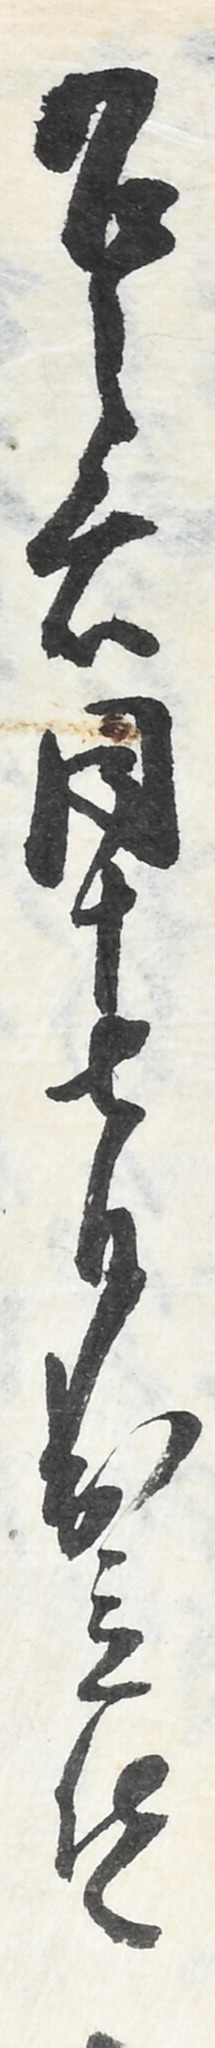右之者同十八日出立仕候

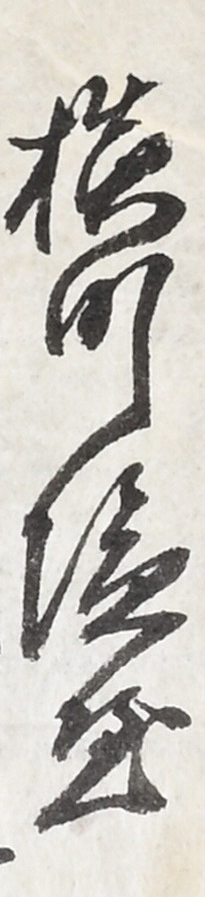横町塩屋
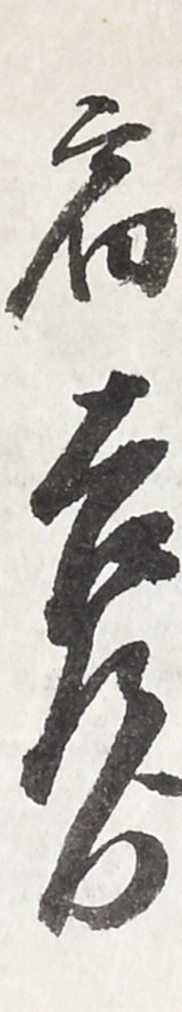宿太右衛門
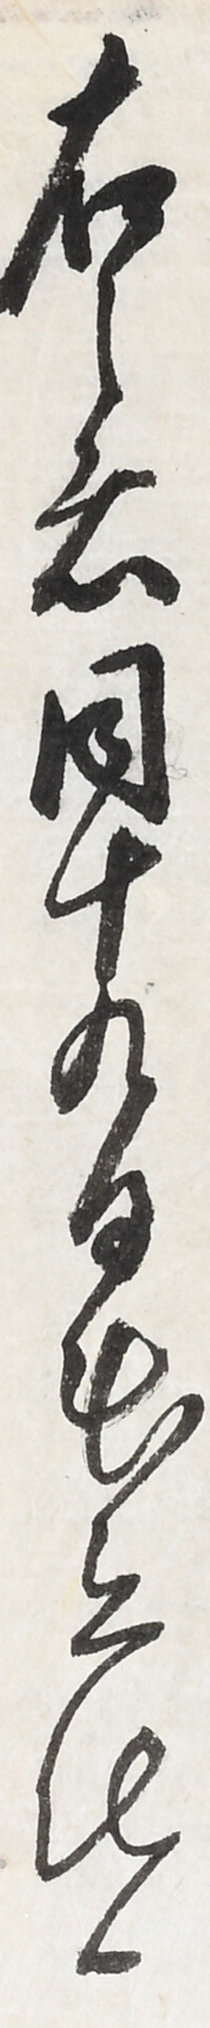右之者同十九日出立仕候
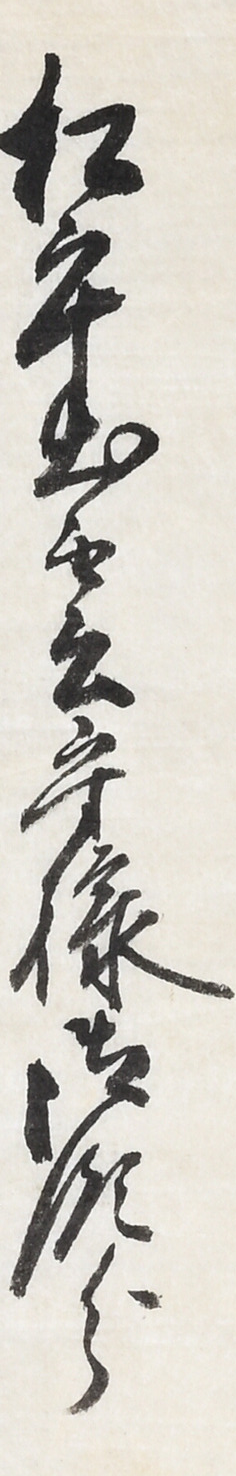松平出雲守様御領分
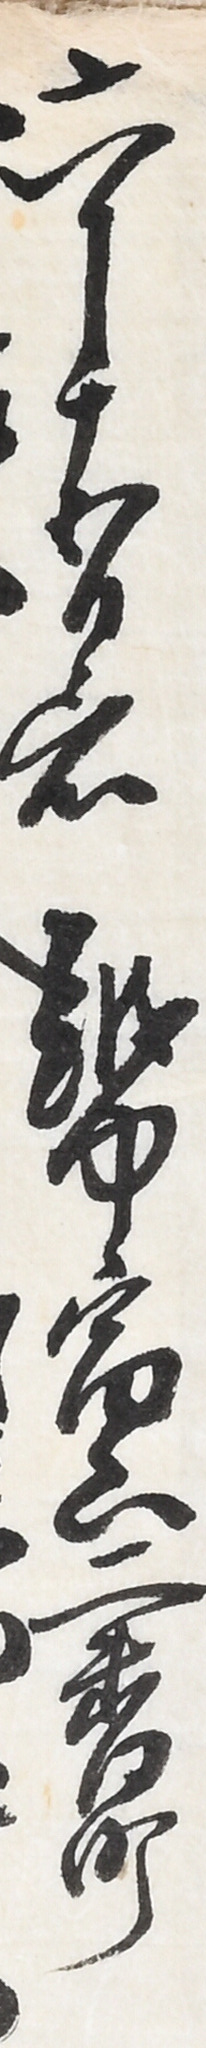六月十五日着越中富山二番町
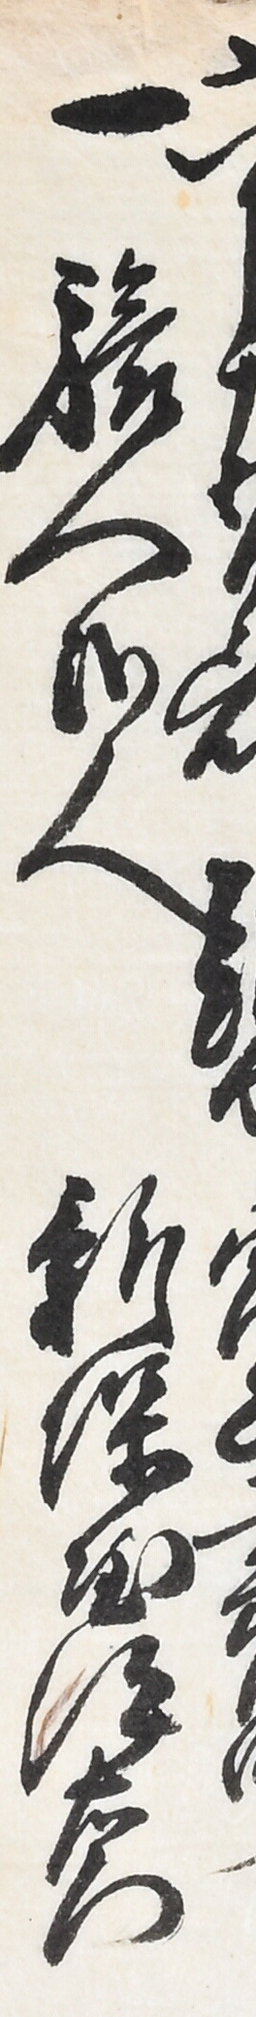一旅人弐人新保屋伊右衛門
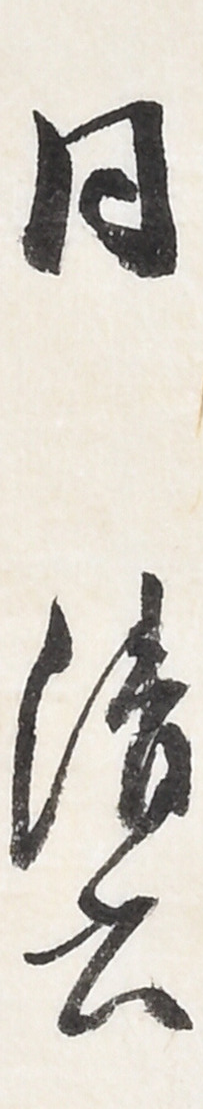同清六
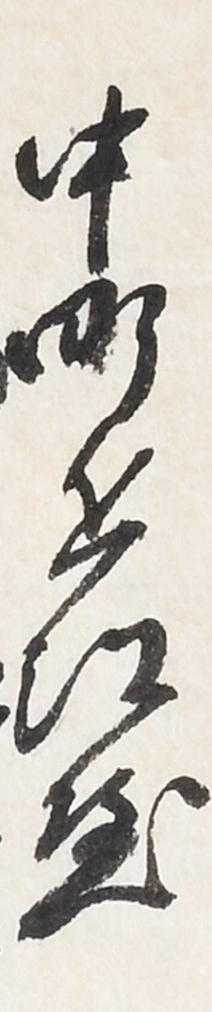中町近江屋
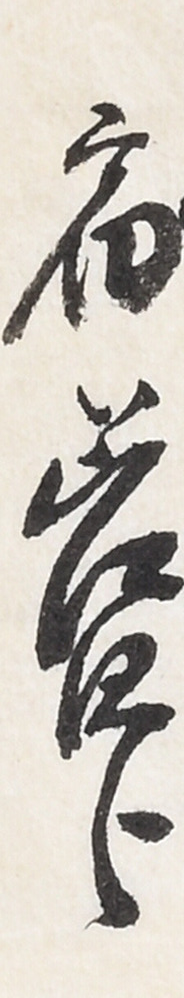宿善四郎
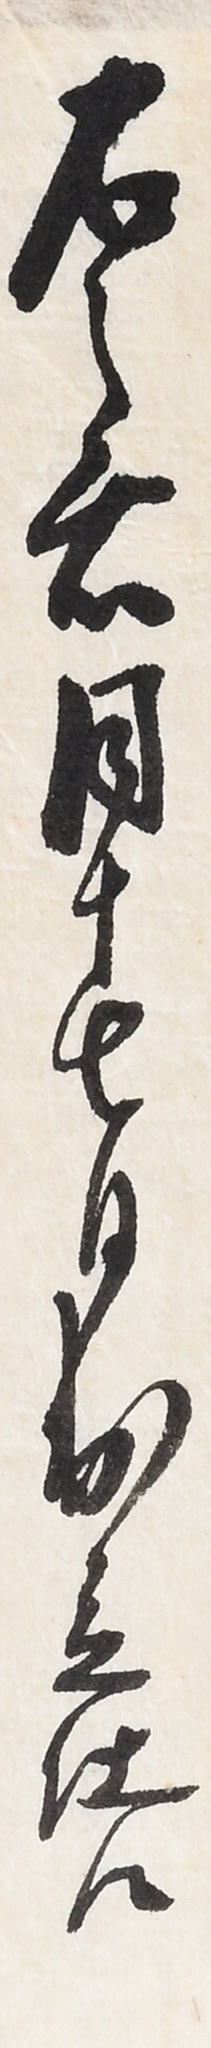右之者同十七日出立仕候
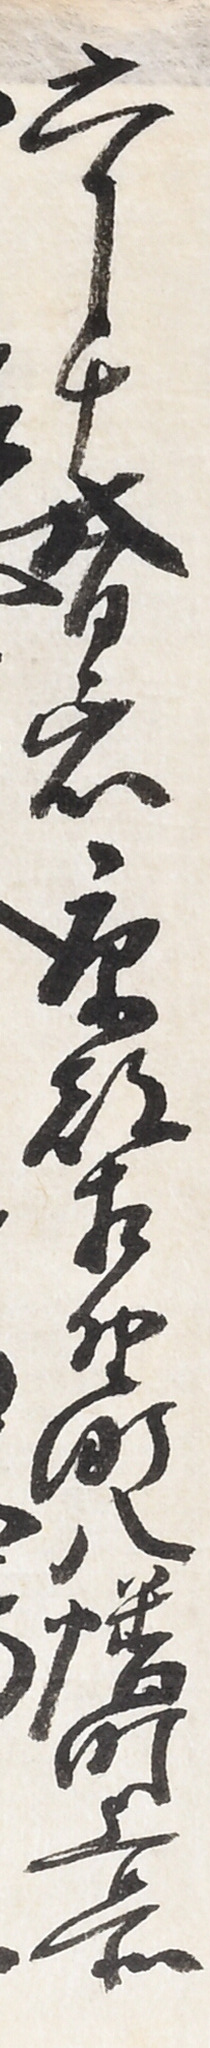六月十八日着京都相野町八幡町上ル所
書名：旅人泊控帳
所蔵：伊那市立高遠町図書館・合同会社AMANE
